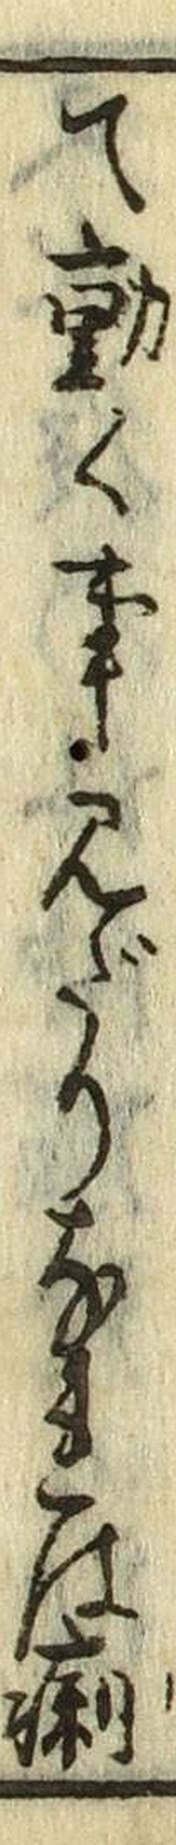て動く事みだりなれは痢
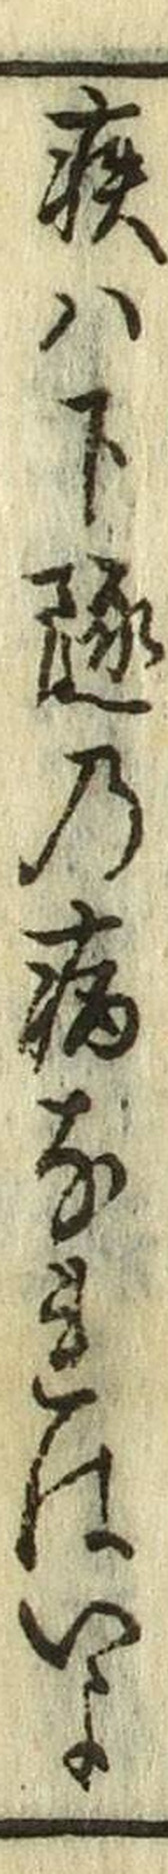疾は下隧の病なれはいよ
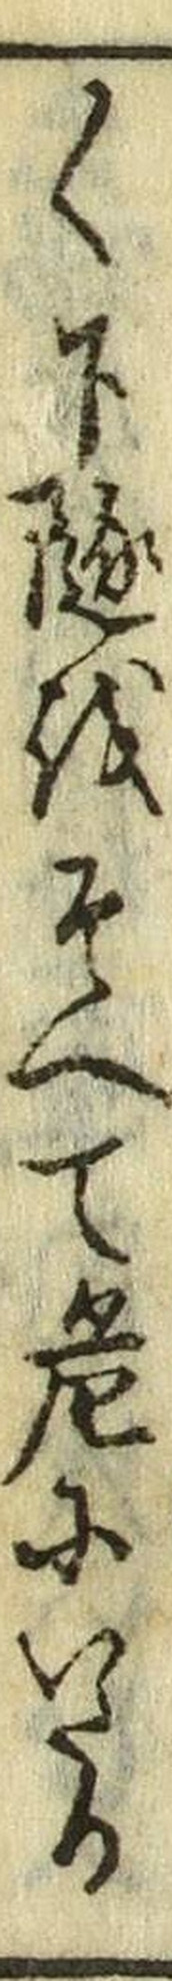〳〵下隧をそへて危にいたる

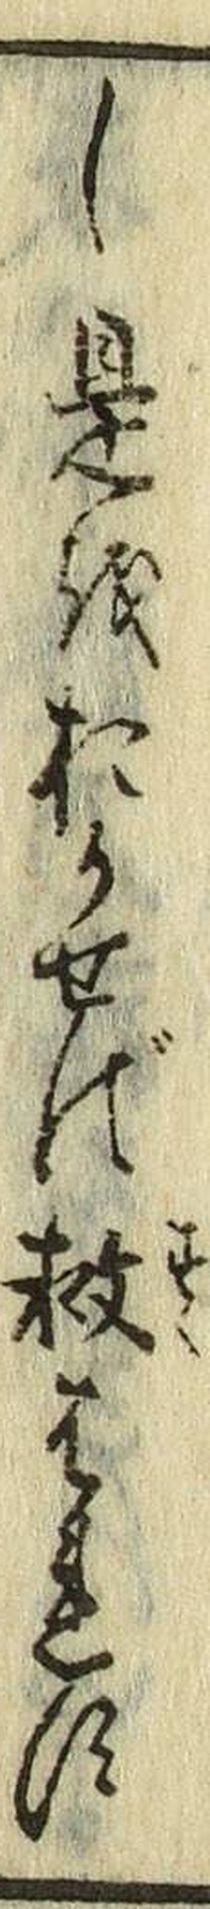し是をおかせば救はれす
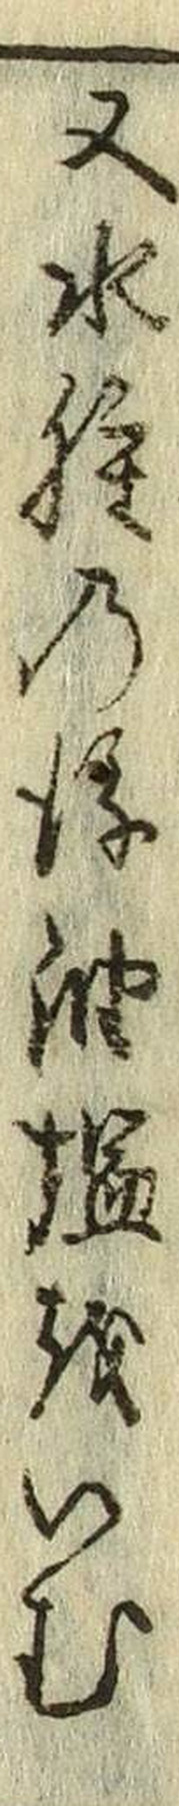又水腫の後油塩をいむ
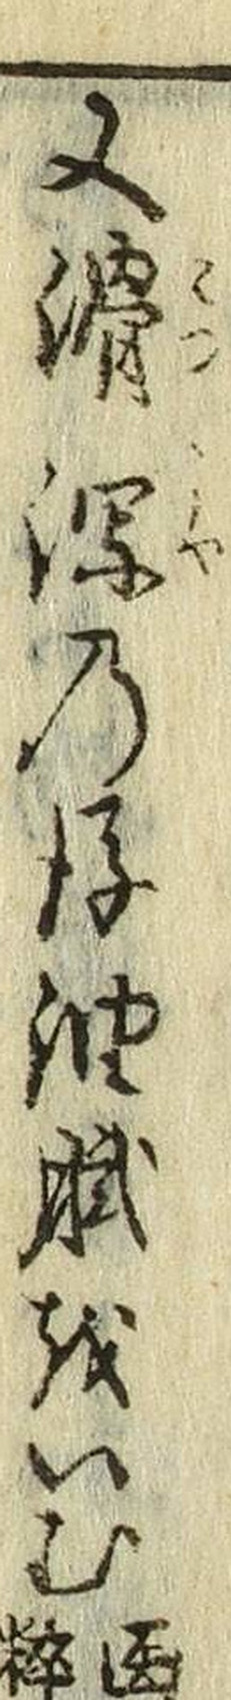又水腫の後油塩をいむ
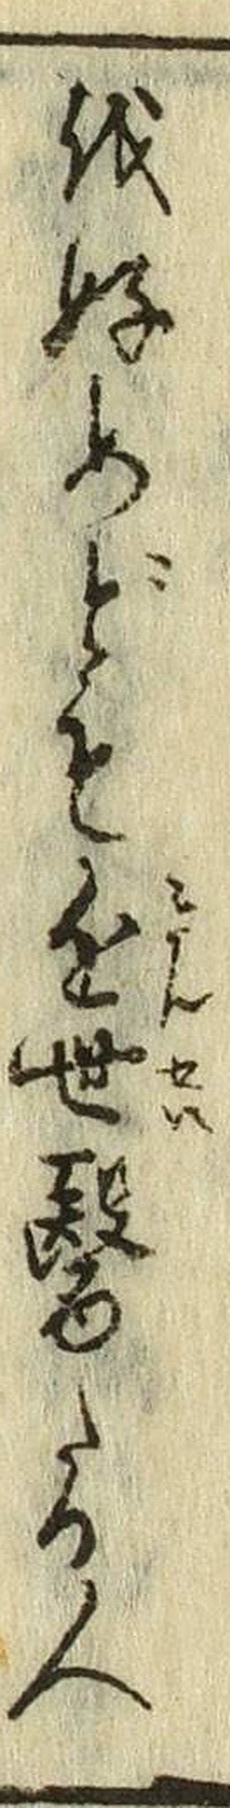を好めども近世医たる人
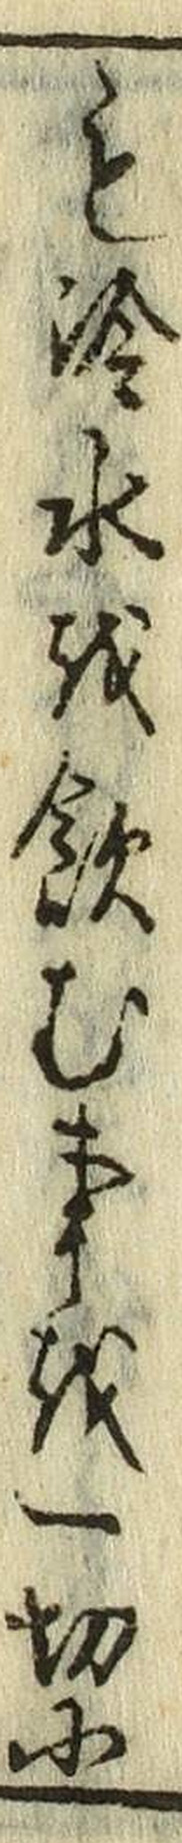も冷水を飲む事を一切に
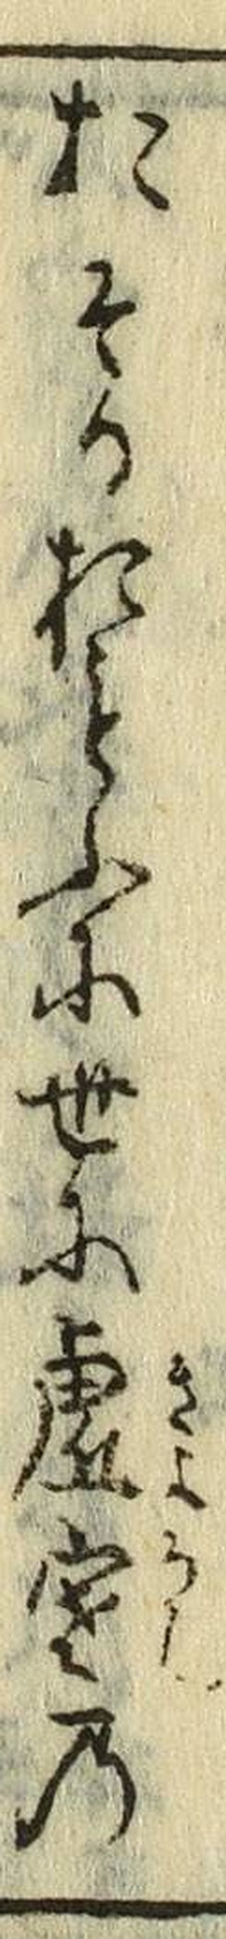おそるおもふに世に虚寒の
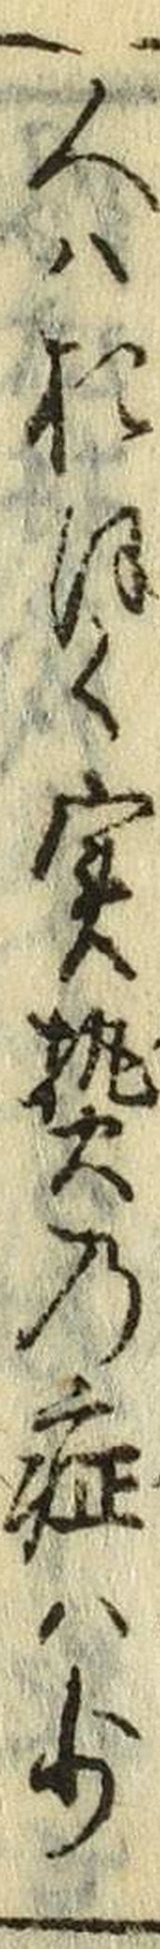人はおほく実熱の症は少
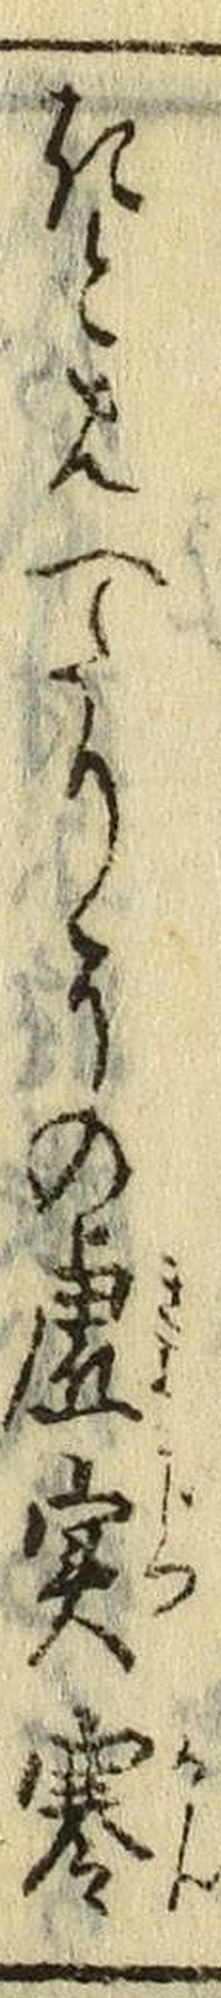きと見へたりその虚実寒
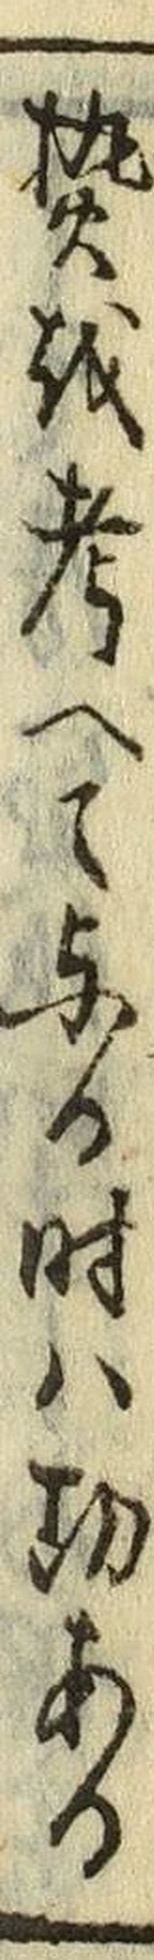熱を考へて与る時は功ある
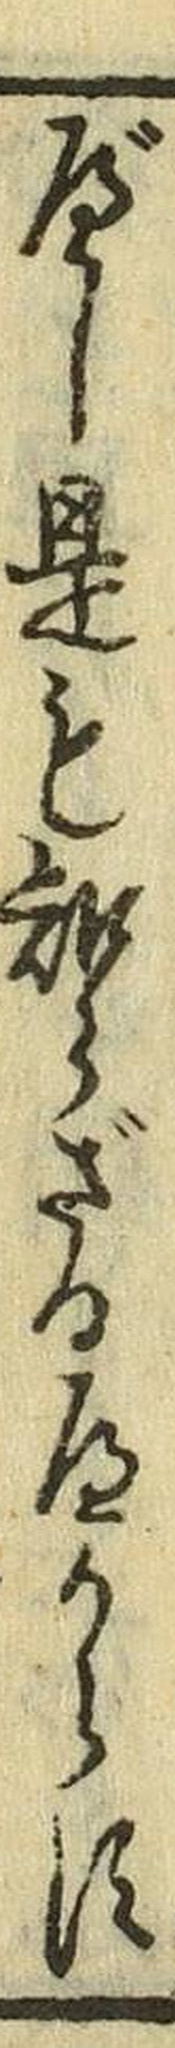べし是を知らざるへからす
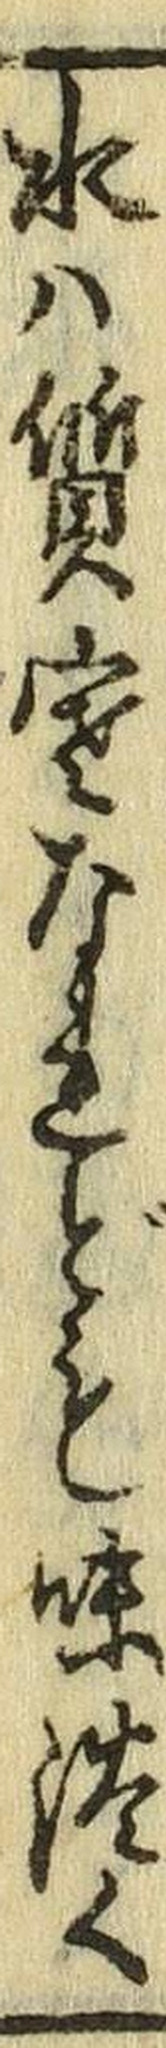水は質寒なれども味淡く
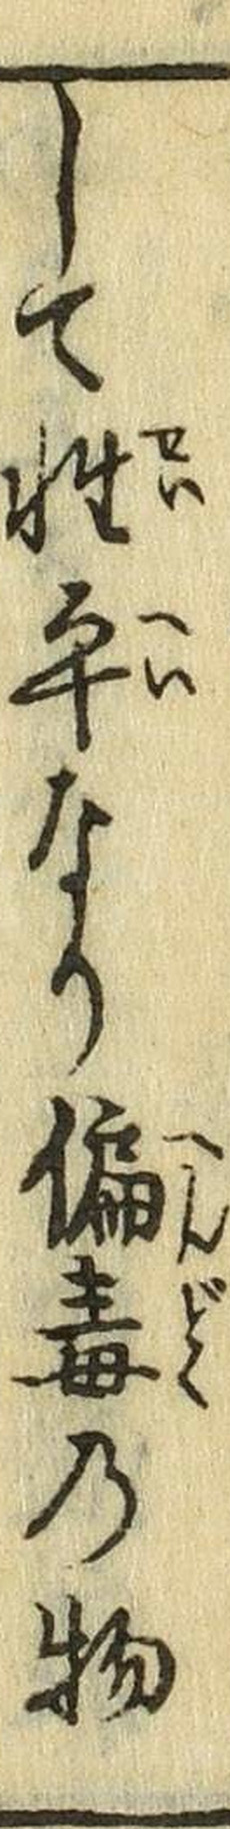して性平なり偏毒の物
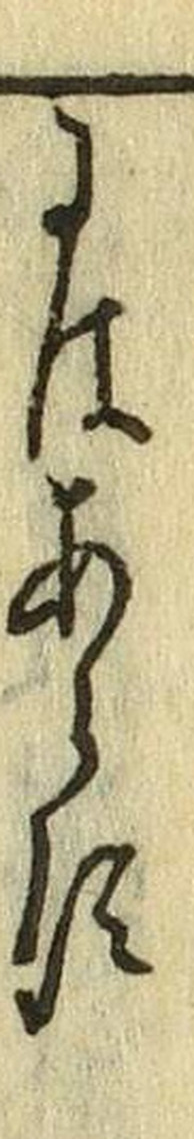にはあらす
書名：居家養生記
